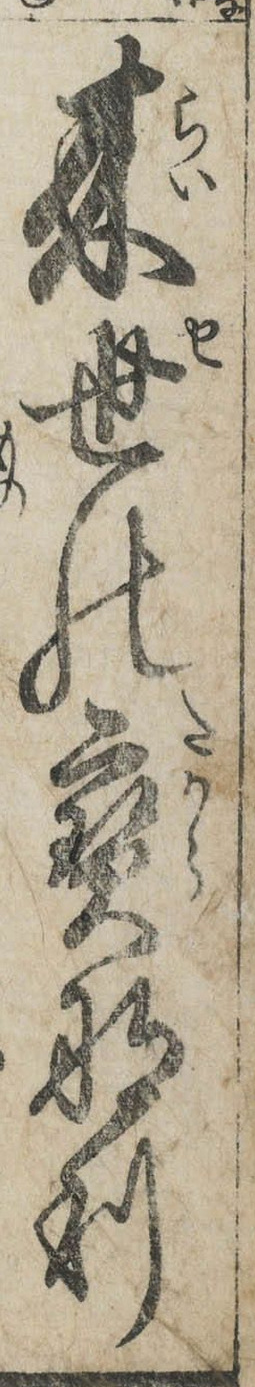来世の宝なり
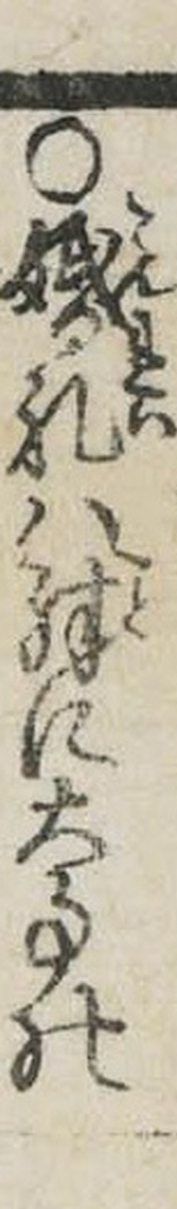○婚礼は殊に大事の
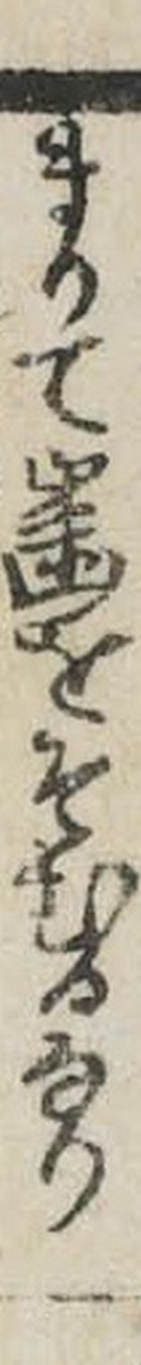まりて歯をそむるなり
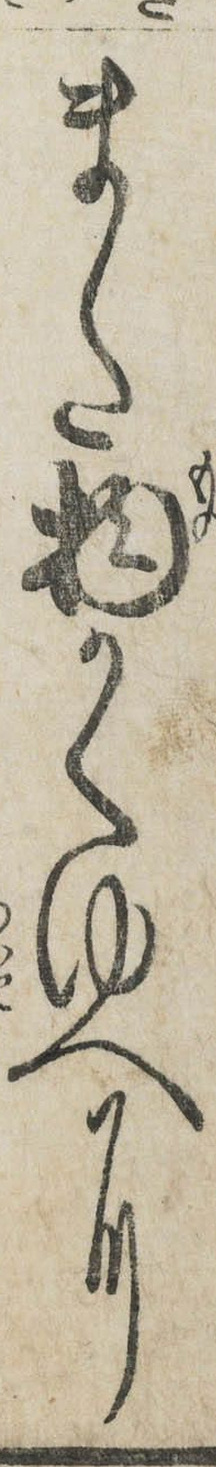また物かくゆへに
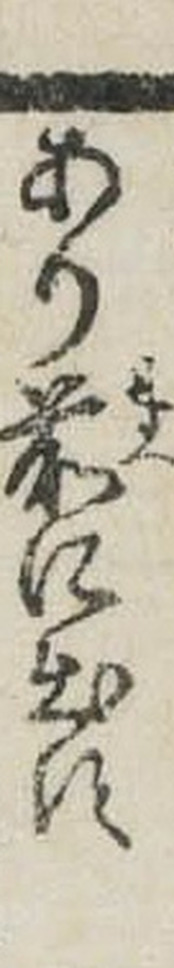あり前に出す
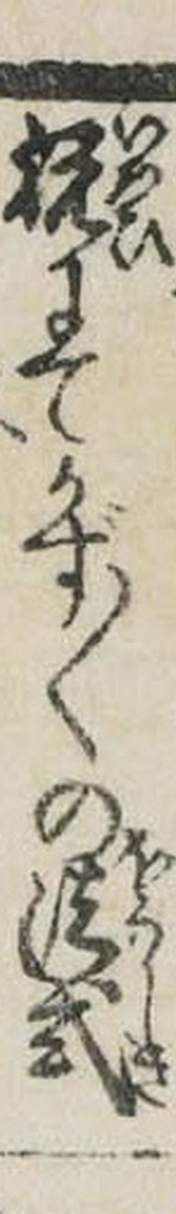祝にてかず〳〵の法式
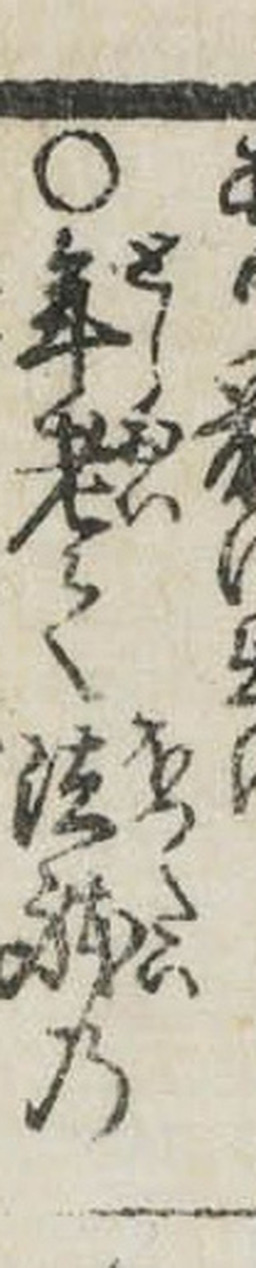○年老て法体の
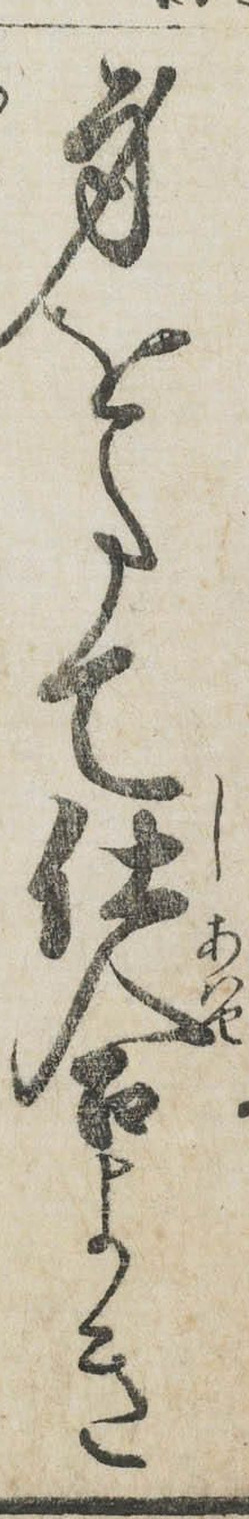身をたて仕合よき
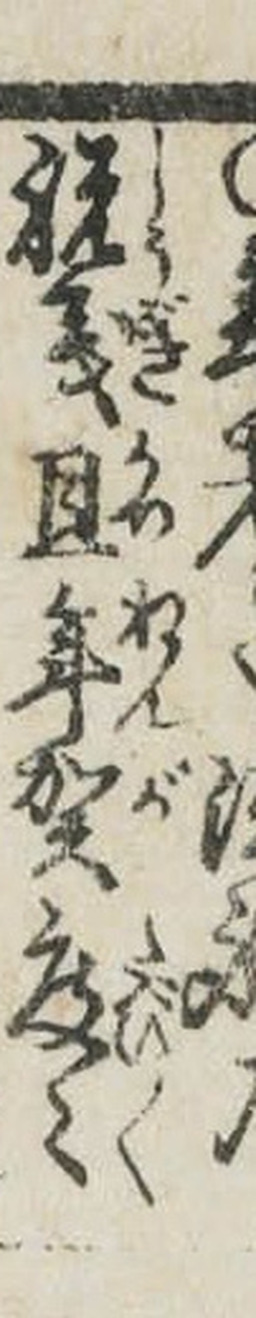祝義且年賀度々
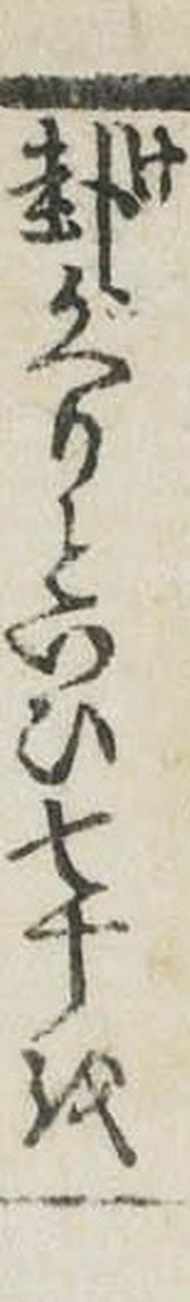卦かへりといひ七十を
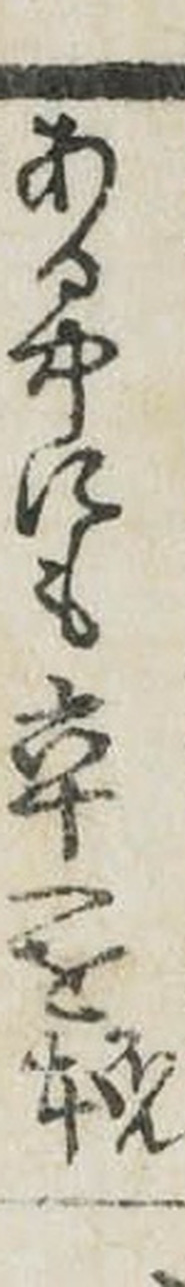ある中にも六十一を本
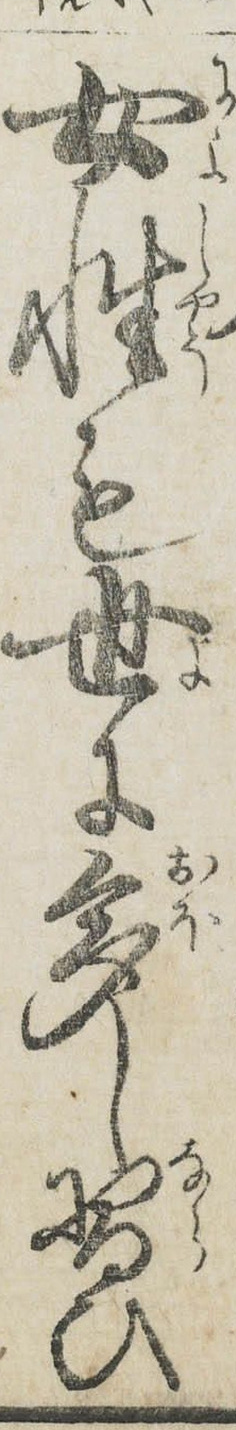女性も世に多し習ひ
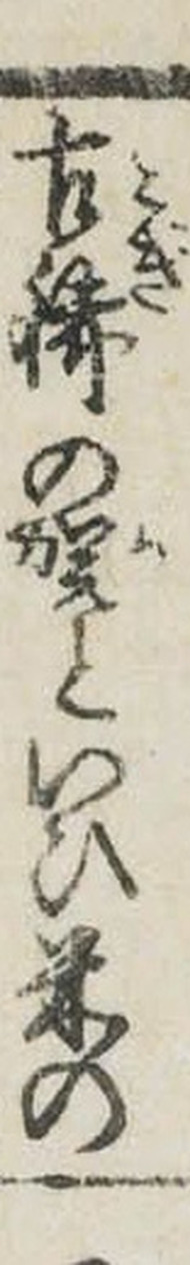古稀の賀といひ米の
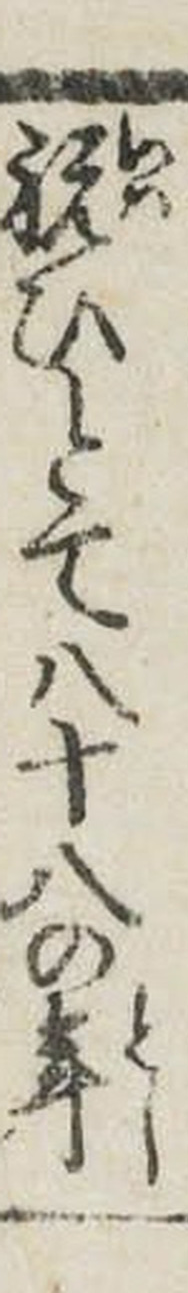祝ひとして八十八の年
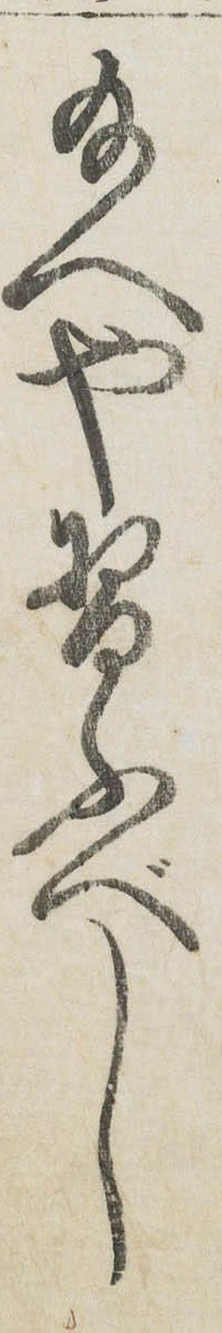給へや習ふべし
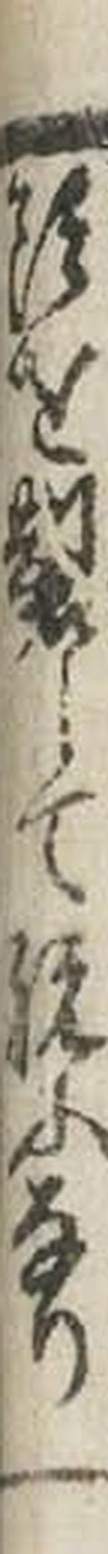頭を製して祝ふなり
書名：頭書萬用婦人手紙之文言
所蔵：東京学芸大学教育コンテンツアーカイブ
